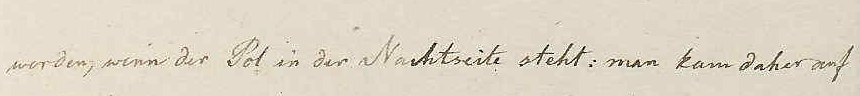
werden, wenn der Pol in der Nachtseite steht: man kam daher auf
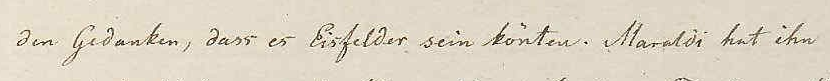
den Gedanken, dass es Eisfelder sein könten. Maraldi hat ihn
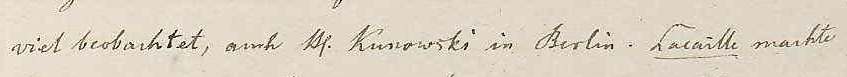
viel beobachtet, auch H￼. Kunowski in Berlin. Lacaille machte
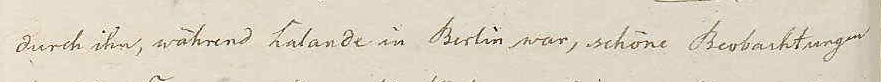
durch ihn, während Lalande in Berlin war, schöne Beobachtungen
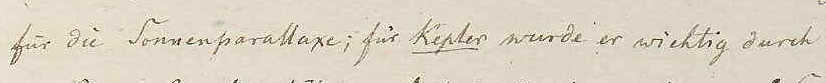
für die Sonnenparallaxe; für Kepler wurde er wichtig durch
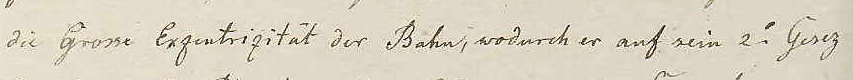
die Ggrosse Exzentrizität der Bahn, wodurch er auf sein 2￼ Gesez
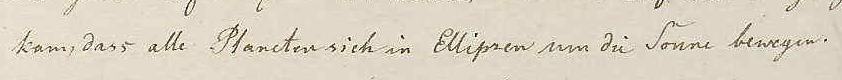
kam, dass alle Planeten sich in Ellipsen um die Sonne bewegen.
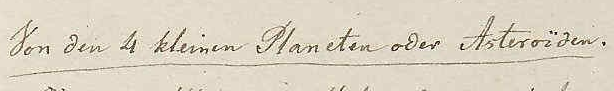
Von den 4 kleinen Planeten oder Asteroïden.
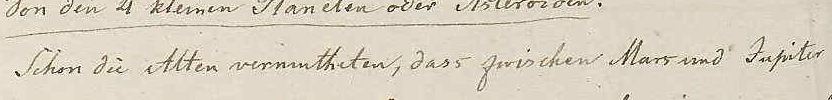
Schon die Alten vermutheten, dass zwischen Mars und Jupiter
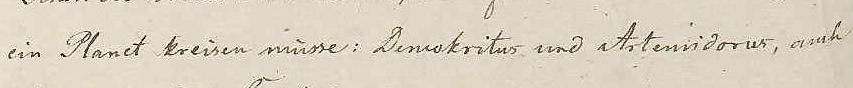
ein Planet kreisen müsse: Demokritus und Artemidorus, auch
